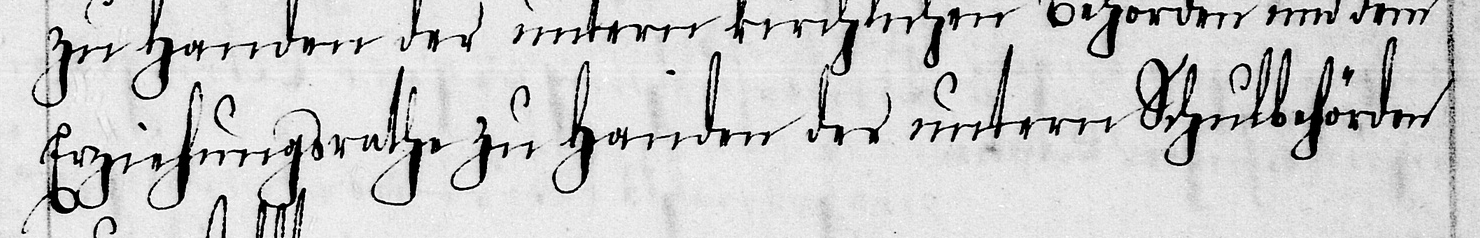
Erziehungsrathe zu Handen der untern Schulbehörden
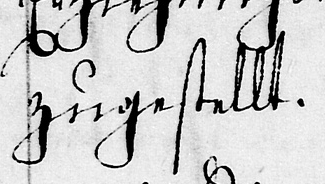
zugestellt.
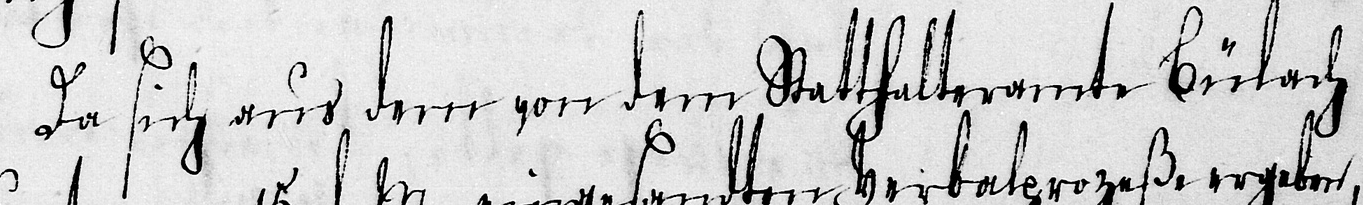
Da sich aus dem von dem Statthalteramte Bülach
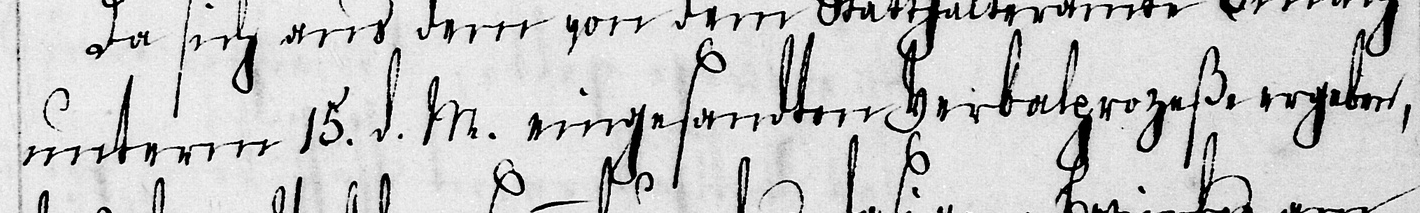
unterm 15. d. M. eingesandten Verbalproceße ergebe¬
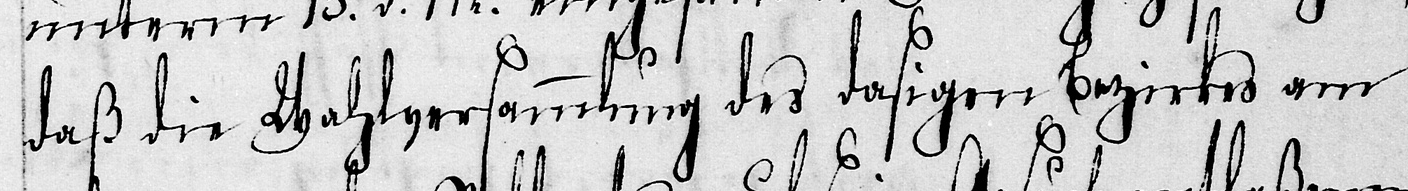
daß die Wahlversammlung des dasigen Bezirkes am
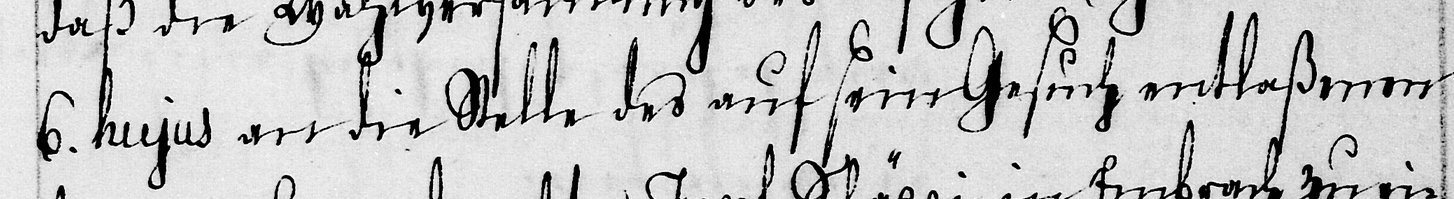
6. hujus an die Stelle des auf sein Gesuch entlaßenen
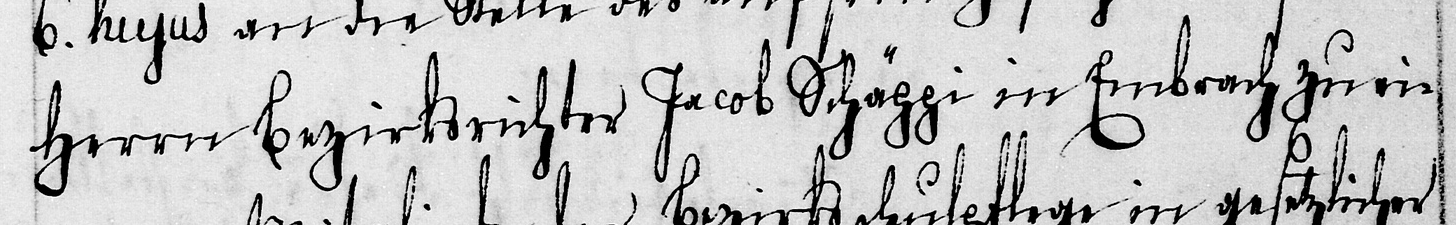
Herrn Bezirksrichter Jacob Schäppi in Embrach zu ei¬
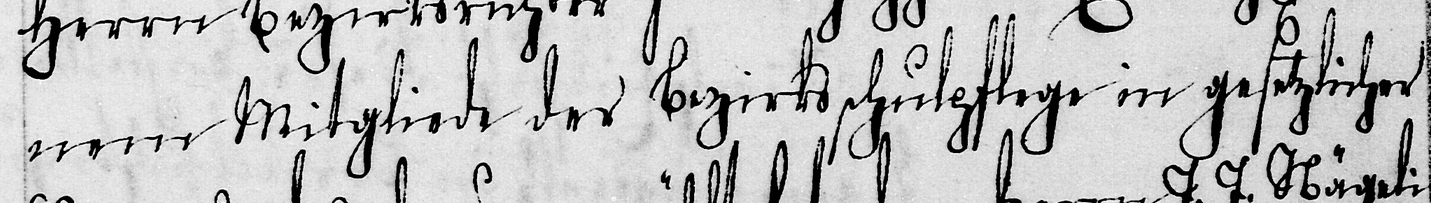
nem Mitgliede der Bezirksschulpflege in gesetzlich¬
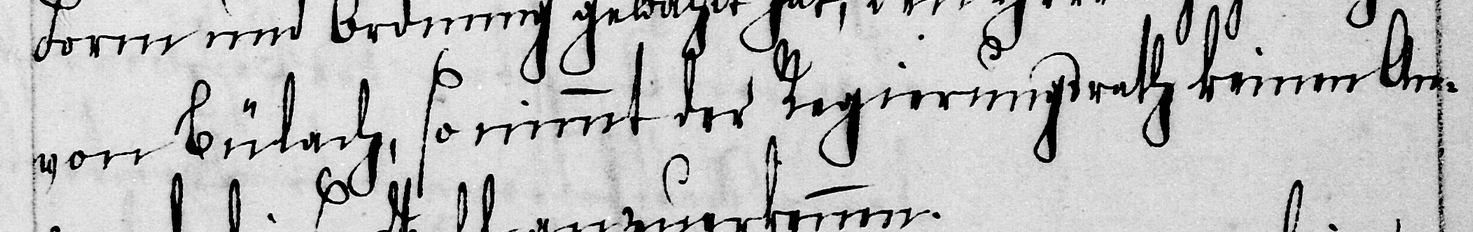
von Bülach, so nimmt der Regierungsrath keinen An¬
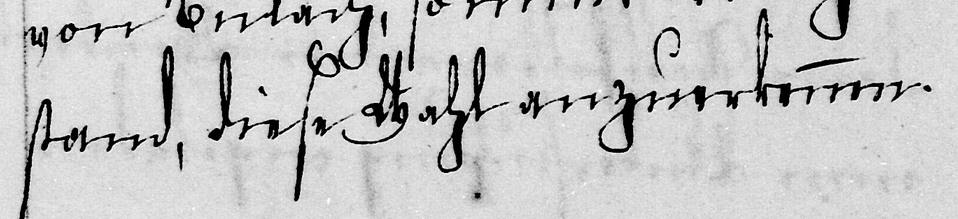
stand, diese Wahl anzuerkennen.
